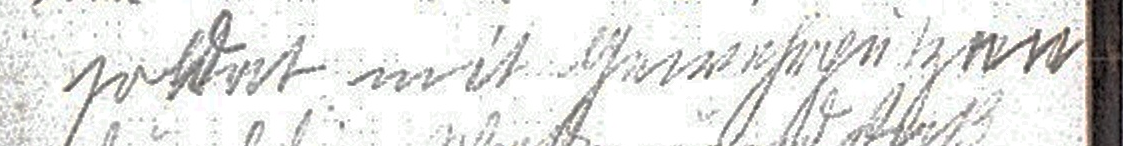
soldat mit Gewehrputzen
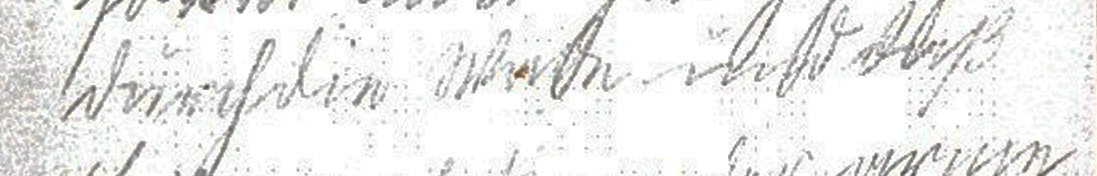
durch die Wade und daß
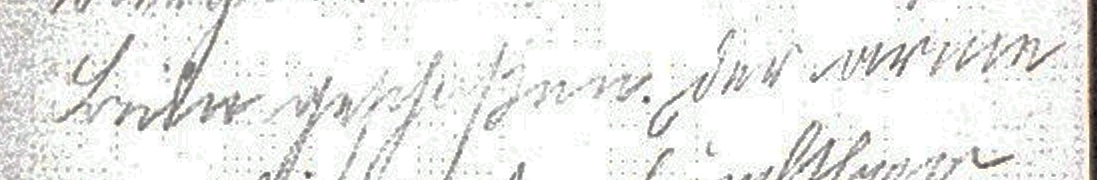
Bein geschoßen. Der arme
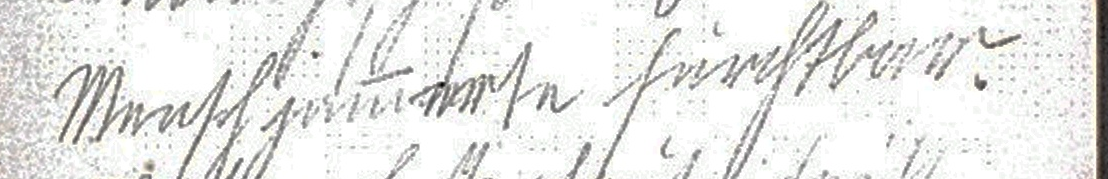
Mann jammerte furchtbar.
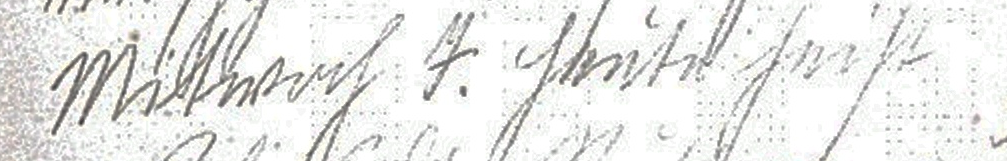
Mittwoch 7. Heute heißt
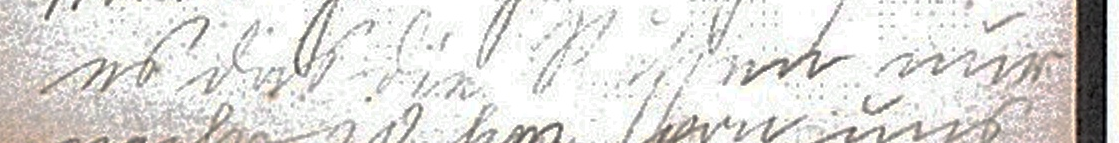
es das die Russen nur
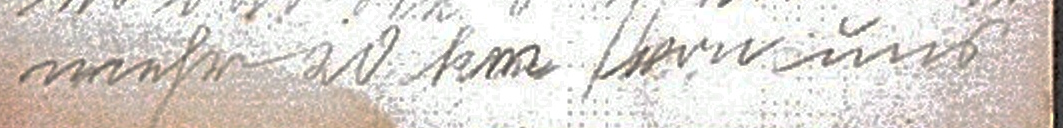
mehr 20 km vor uns
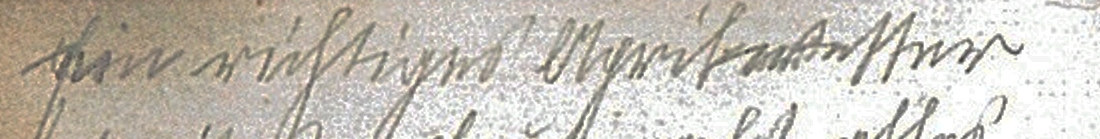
ein richtiges Aprilwetter
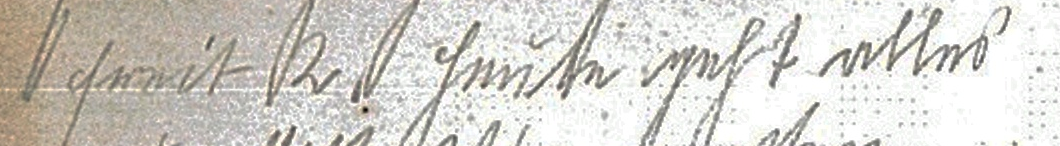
Freit 2. Heute geht alles
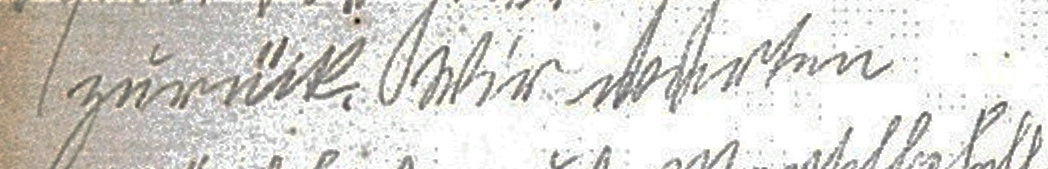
zurück. Wir warten
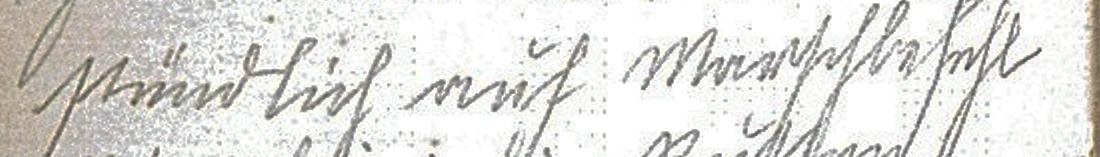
stündlich auf Marschbefehl
